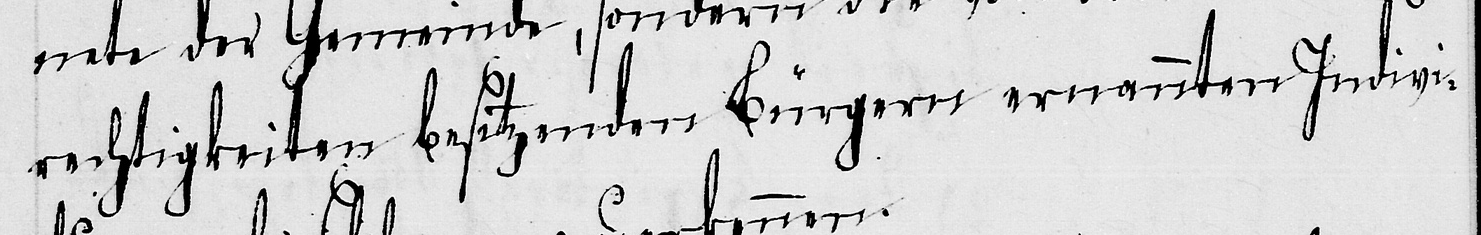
rechtigkeiten besitzenden Bürgern ernannten Indivi¬
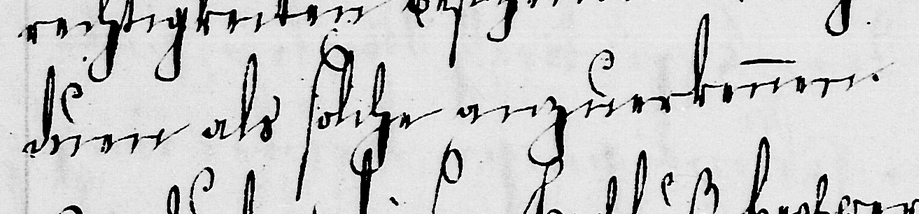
duen als solche anzuerkennen.
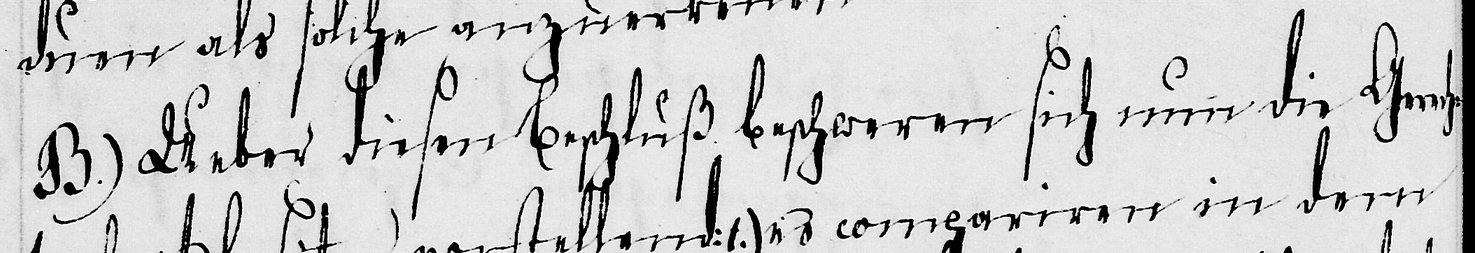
B.) Ueber diesen Beschluß beschweren sich nun die Gere¬
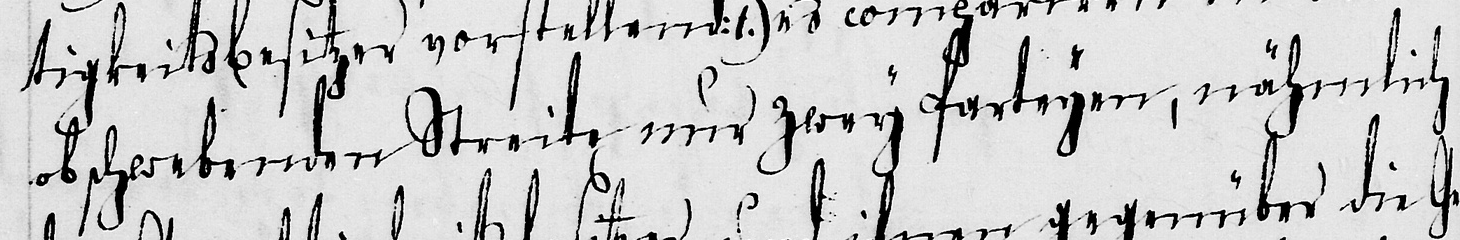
obschwebenden Streite nur zwey Parteyen, nähmlich
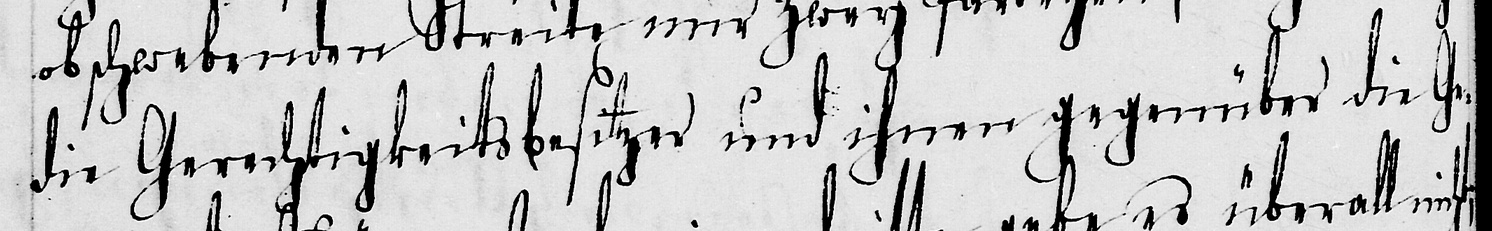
die Gerechtigkeitsbesitzer und ihnen gegenüber die G¬
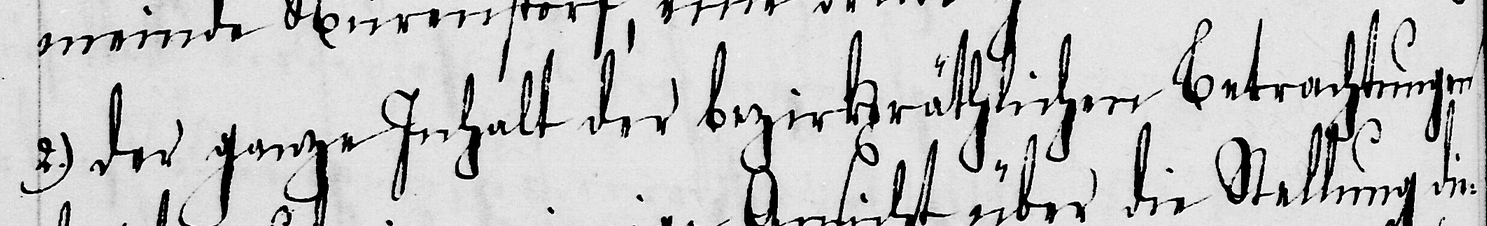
2.) der ganze Inhalt der bezirksräthlichen Betrachtungen
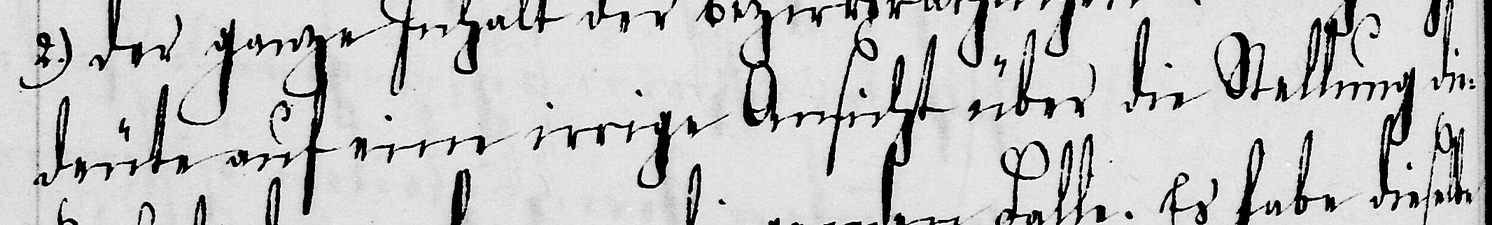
deute auf eine irrige Ansicht über die Stellung di¬
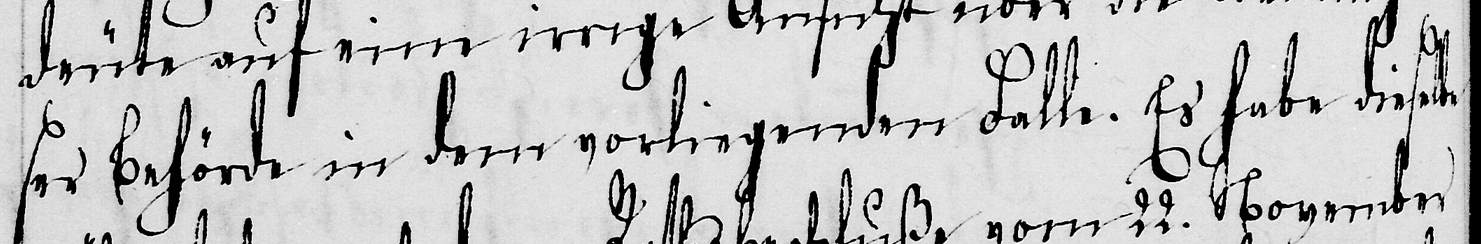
ser Behörde in dem vorliegenden Falle. Es habe diese¬
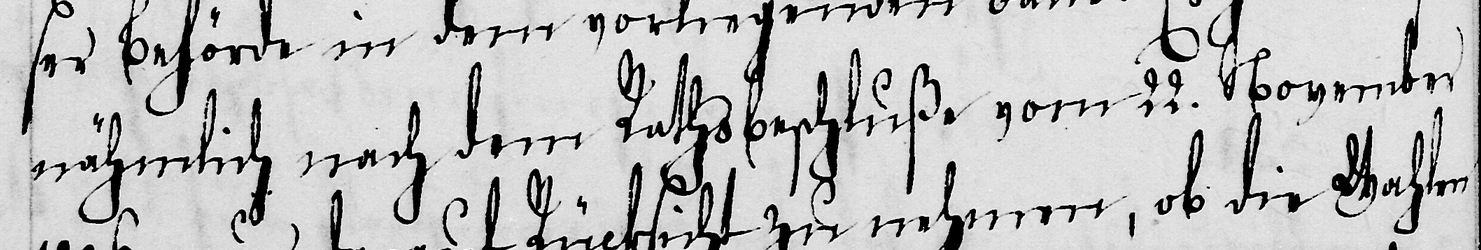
nähmlich nach dem Rathsbeschluße vom 22. November
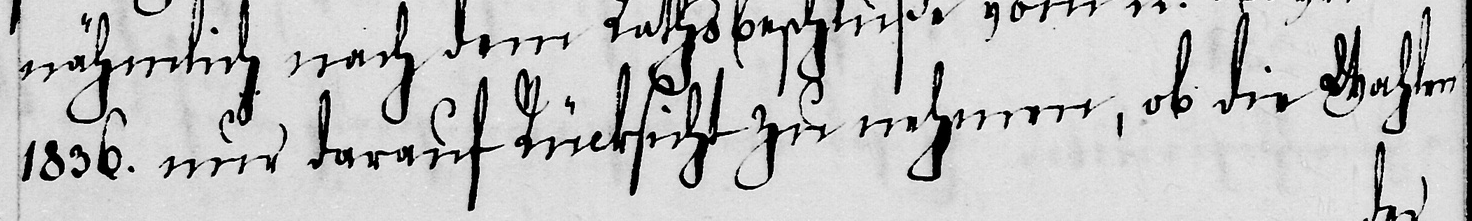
1836. nur darauf Rücksicht zu nehmen, ob die Wahlen
